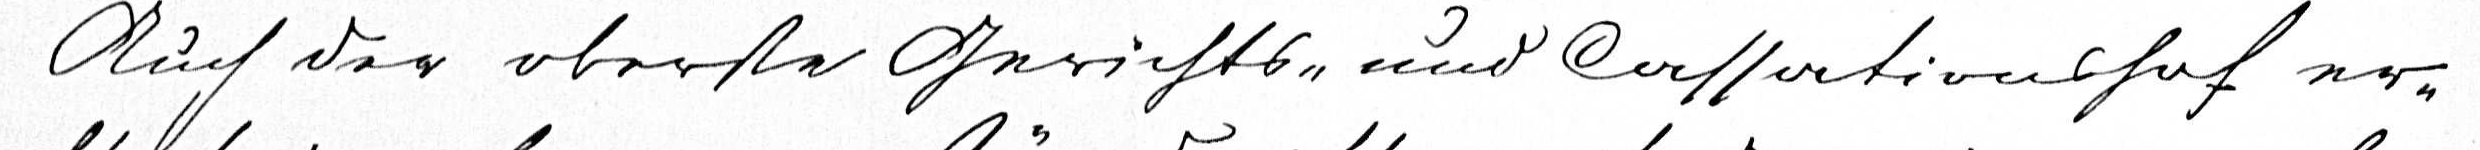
Auch der oberste Gerichts- und Cassationshof er¬
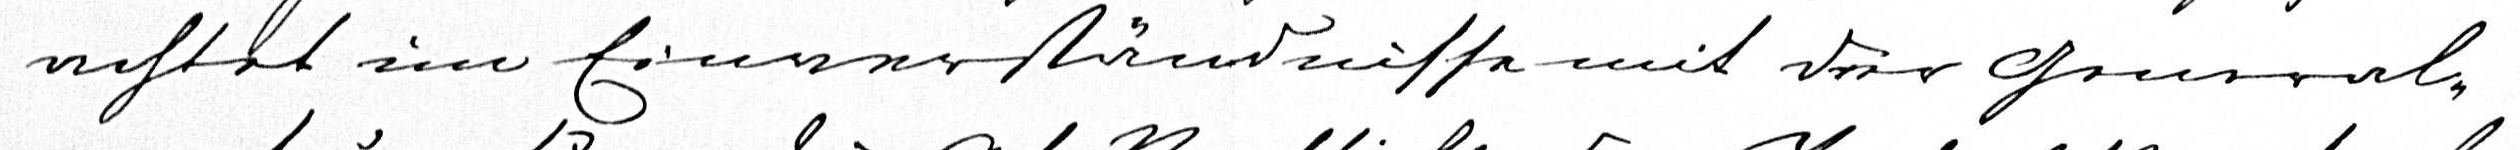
achtet ein einversändnisse mit der General¬
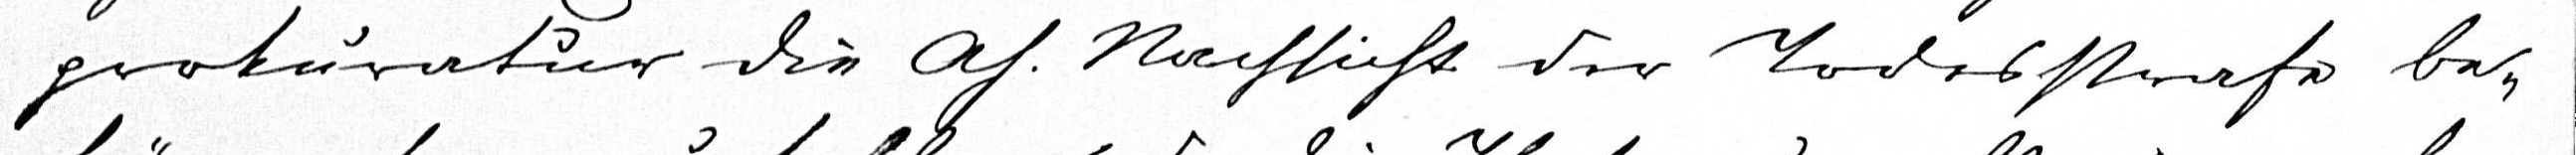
prokuratur die Ah. Nachsicht der Todesstrafe be¬
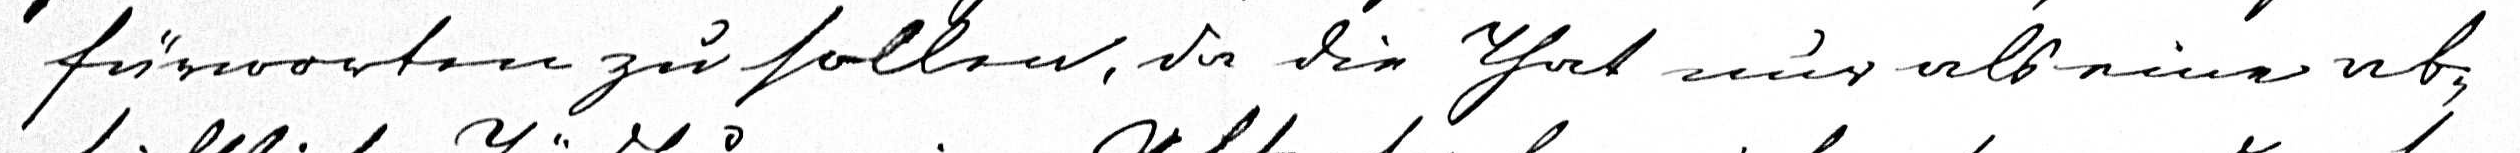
fürworten zu sollen, da die That nur als eine ab¬
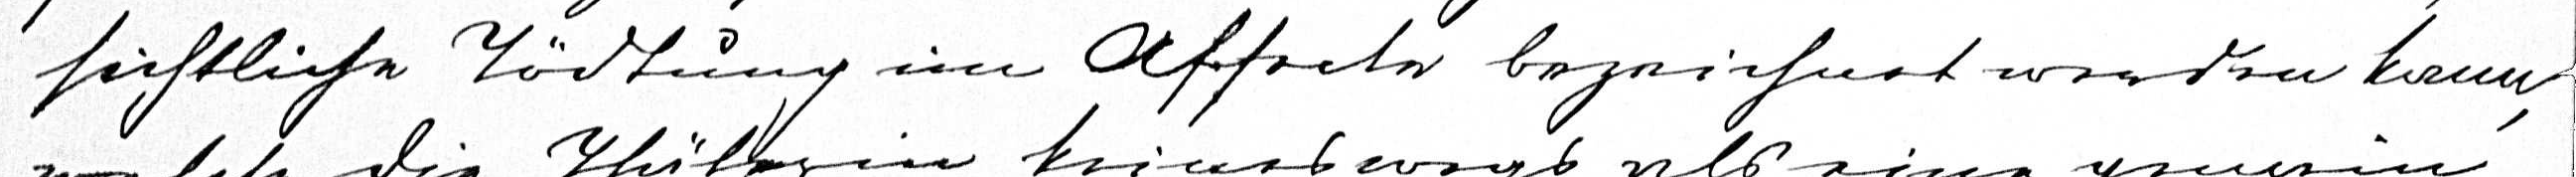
sichtliche Tödtung im Affecte bezeichnet werden kann,
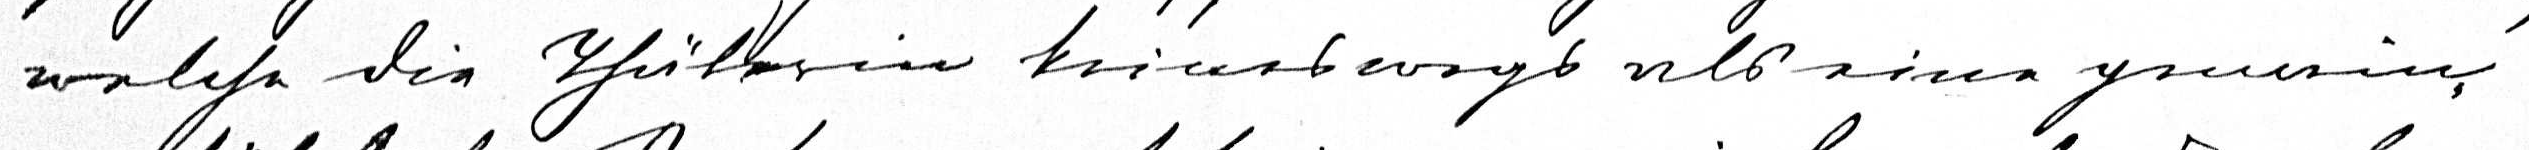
welche die Thäterin keineswegs als eine gemein¬
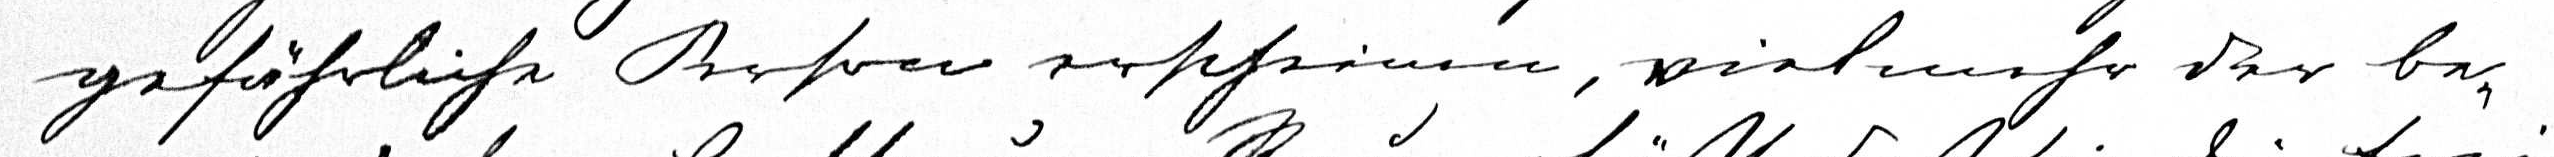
gefährliche Person erscheinen, vielmehr der be¬
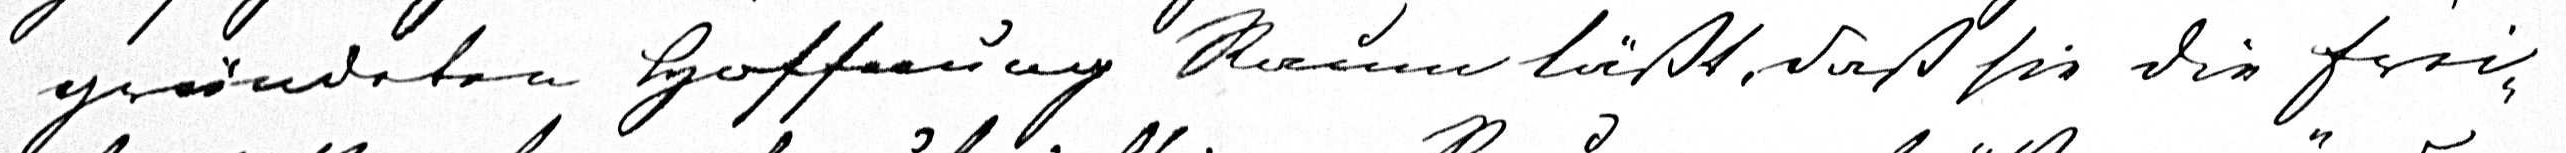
gründeten Hoffnung Raum läßt, daß sie die Frei¬
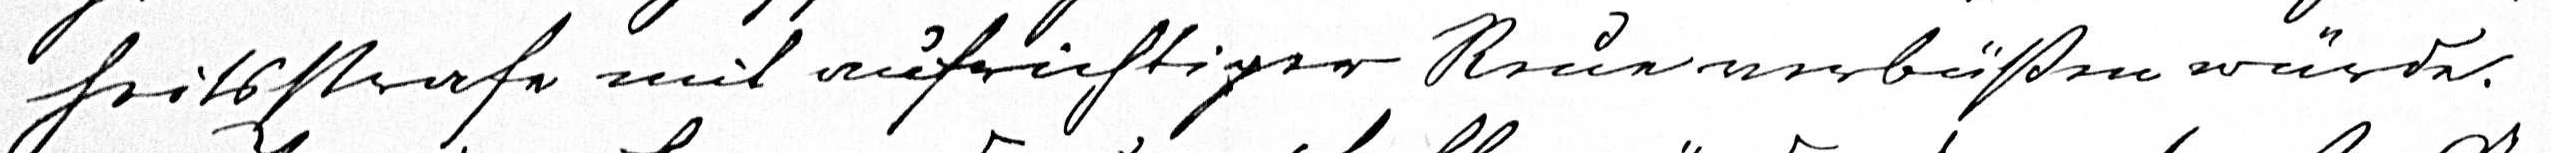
heitsstrafe mit aufrichtiger Reue verbüßen würde.
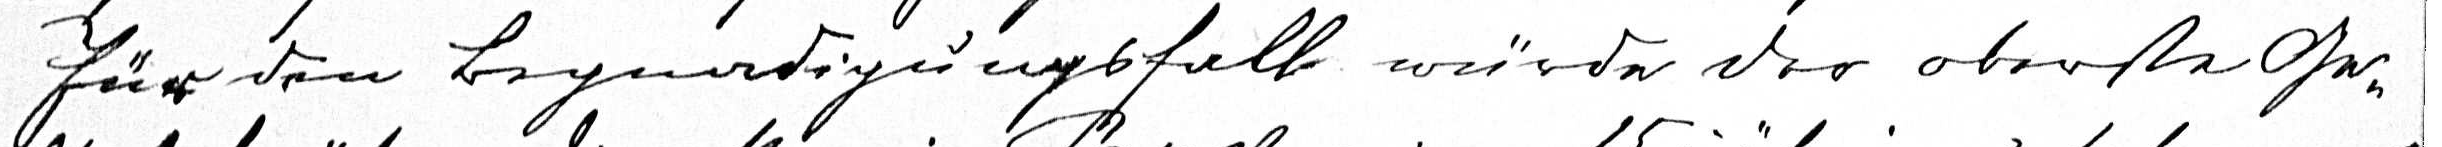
Für den Begnadigungsfall würde der oberste Ge¬
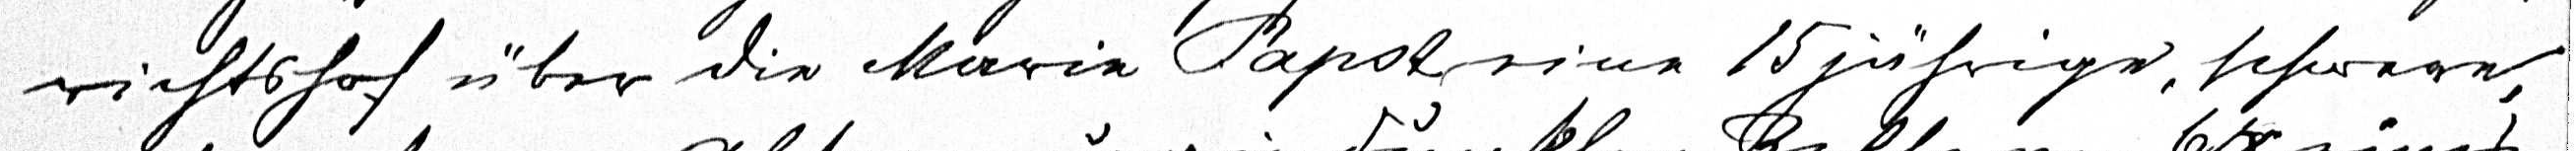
richtshof über die Marie Papst eine 15jährige, schwere,
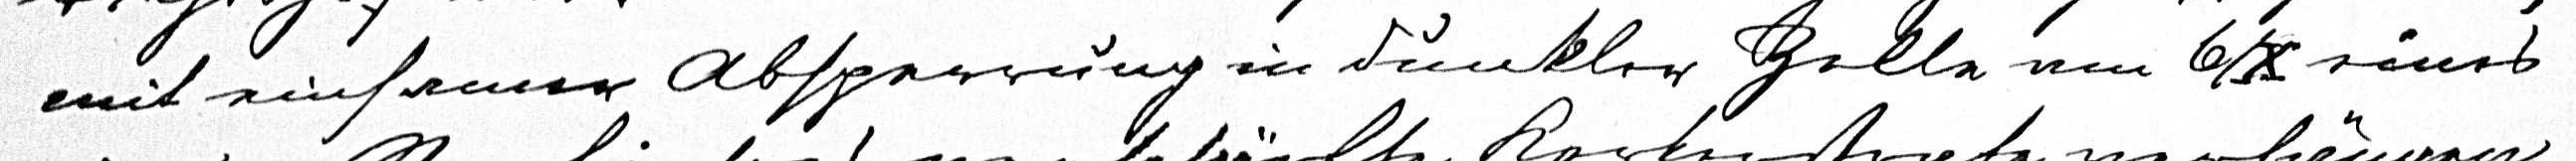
mit einsamer Absperrung in dunkler Zelle am 6/X eines
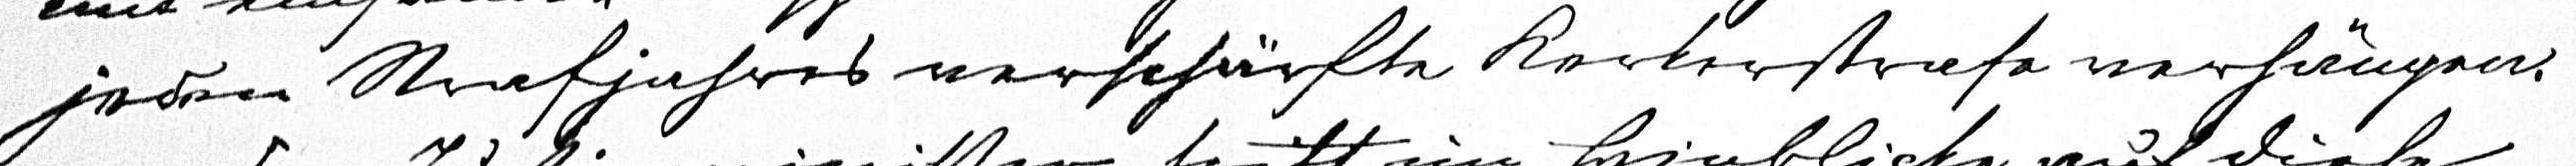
jeden Strafjahres verschärfte Kerkerstrafe verhängen.
